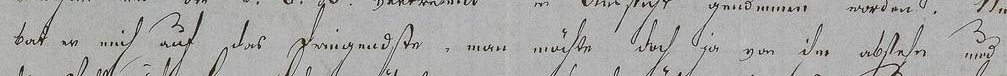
bat er mich auf das Dringendste, man möchte doch ja von ihm absehn und
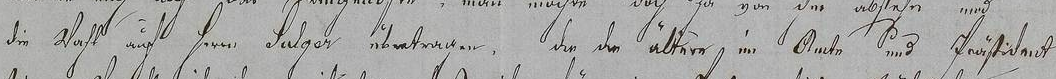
die Wahl auf Herrn Sulger übertragen, der der ältere im Amte und Präsident
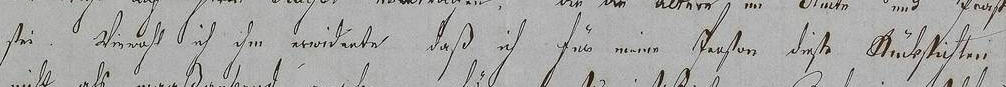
sei. Wiewohl ich ihm erwiderte daß ich für meine Person diese Rücksichten
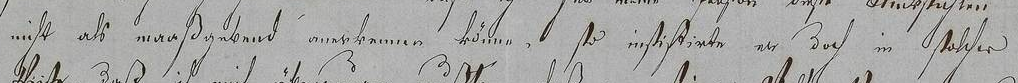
nicht als maaßgebend anerkennen könne, so insistirte er doch in solcher
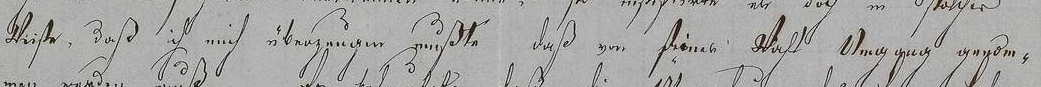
Weise, daß ich mich überzeugen mußte daß von seiner Wahl Umgang genom-
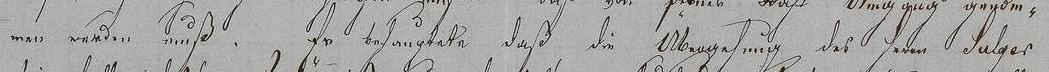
men werden muß. Er behauptete daß die Übergehung des Herrn Sulger
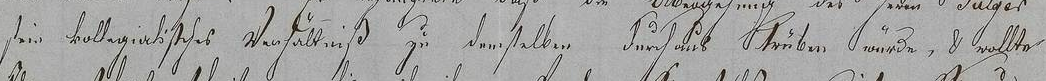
sein kollegialisches Verhältniß zu demselben durchaus trüben würde, & wollte
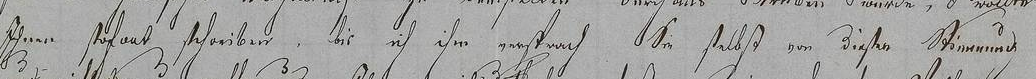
Ihnen sofort schreiben, bis ich ihm versprach Sie selbst von dieser Stimmung
